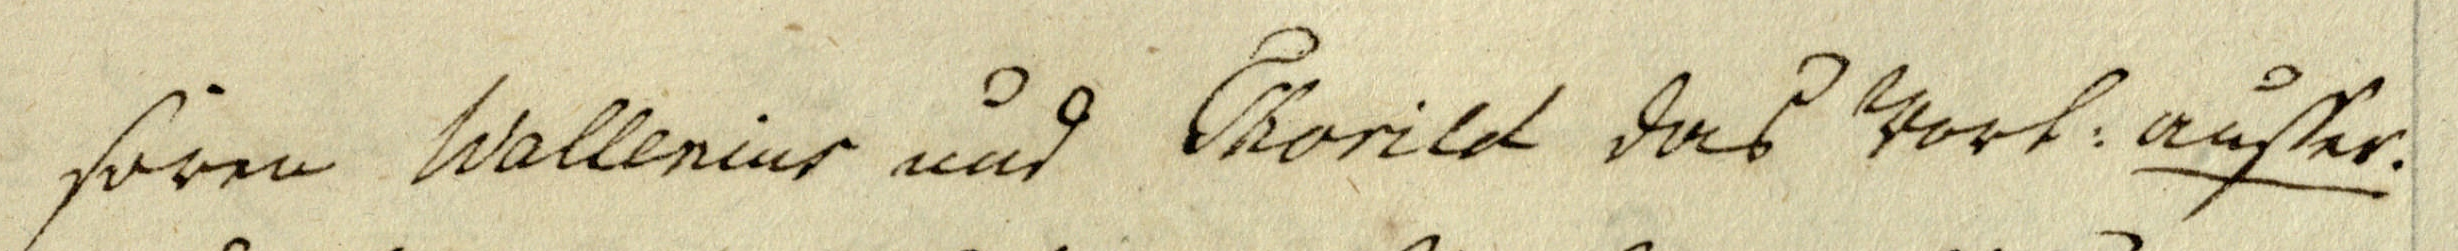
soren Wallenius und Thorild das Wort, außer¬
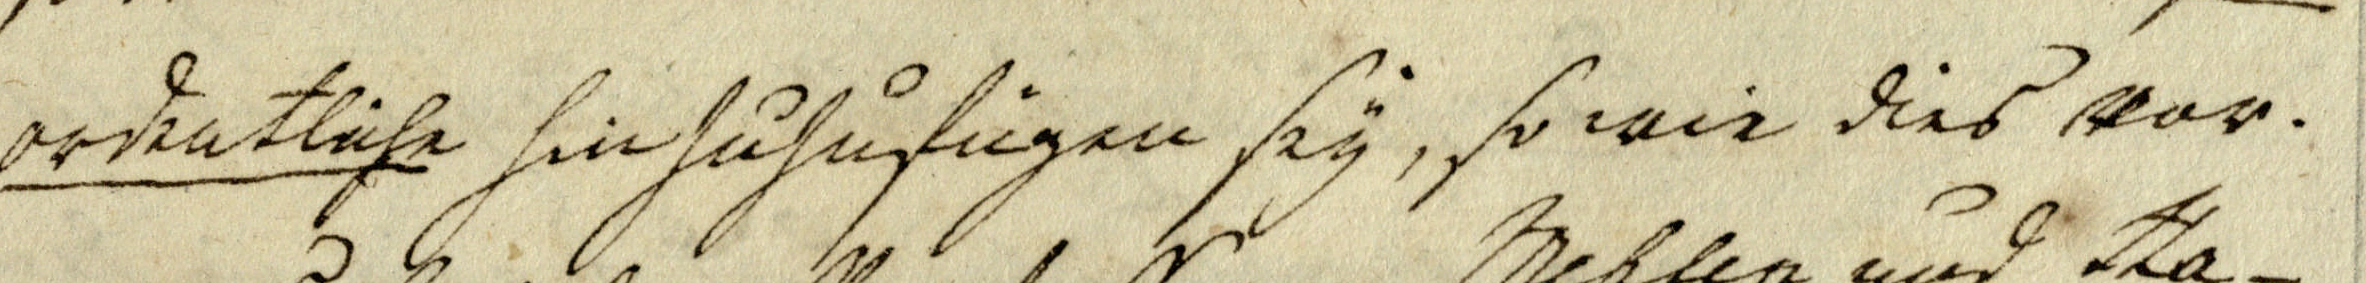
ordentliche hinzuzufügen seÿ, so wie dies vor
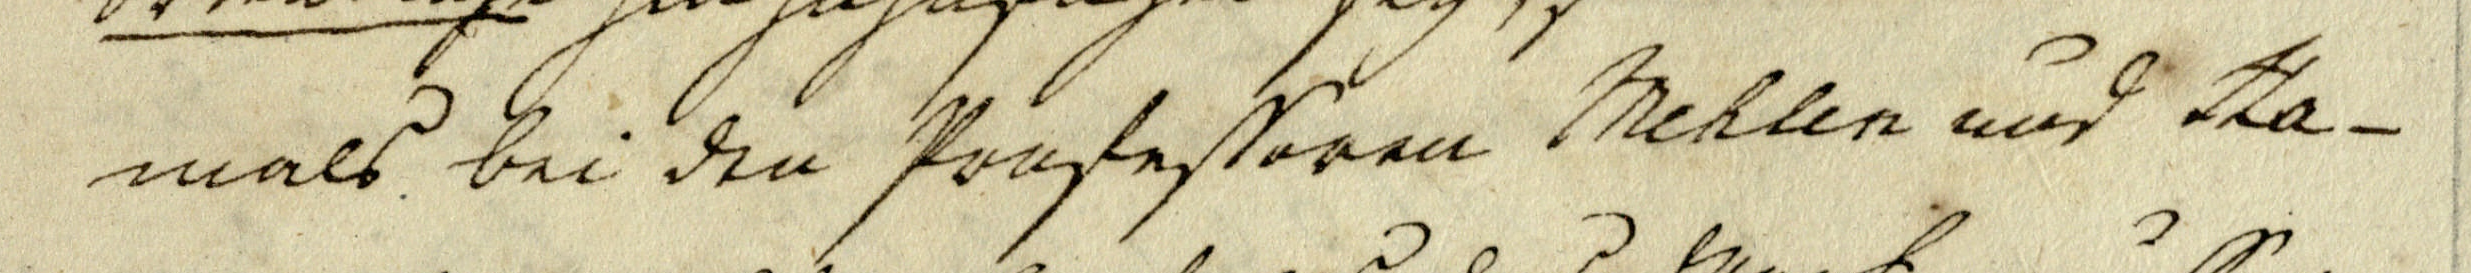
mals bei den Professoren Mehlen und Ha¬
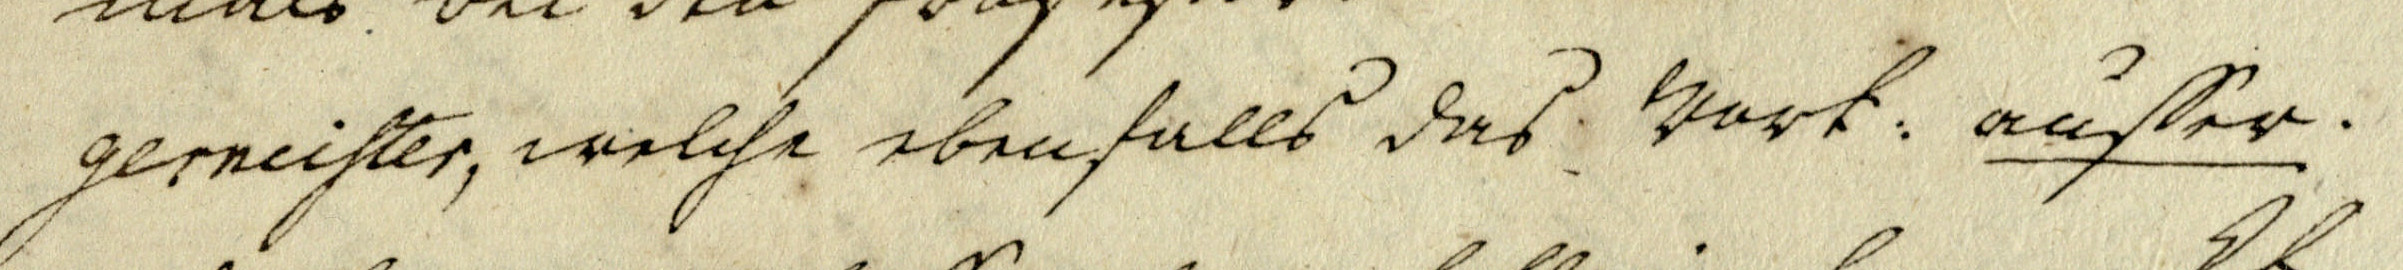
gemeister, welche ebenfalls das Wort: ausser¬
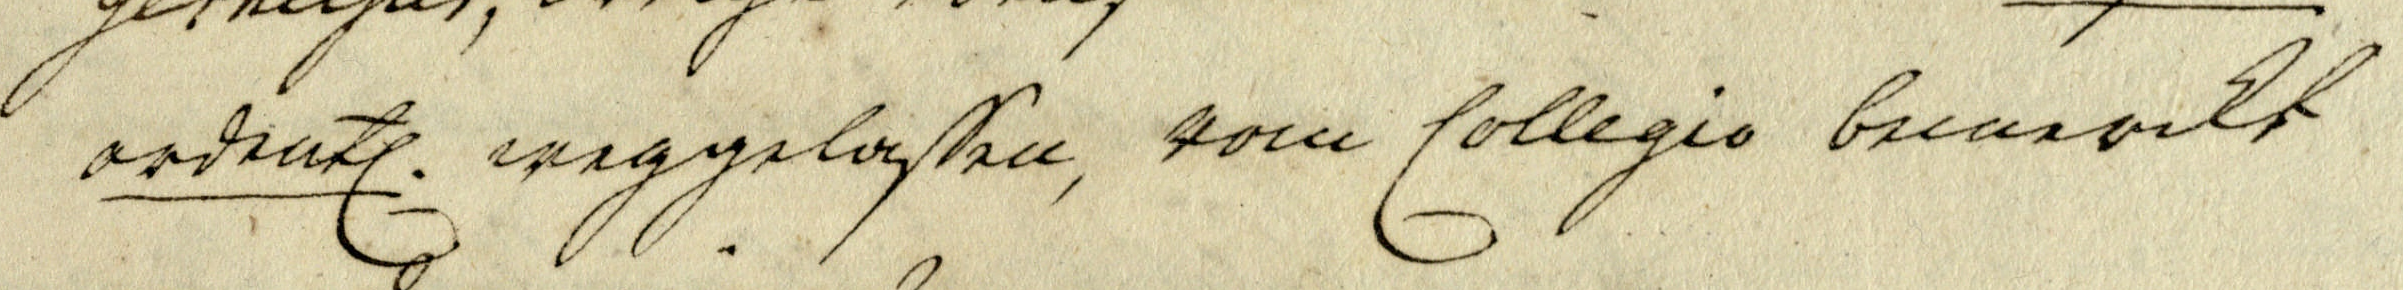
ordentl. weggelassen, vom Collegio bemerckt
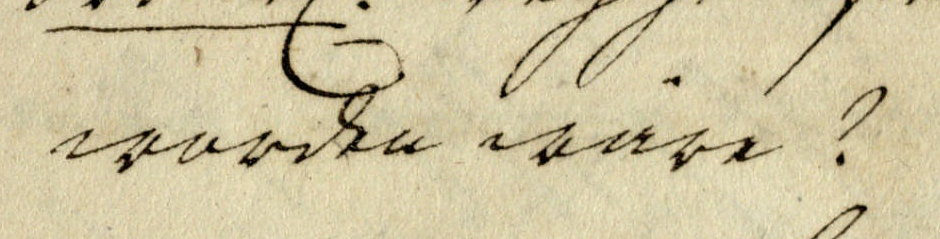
worden wäre?
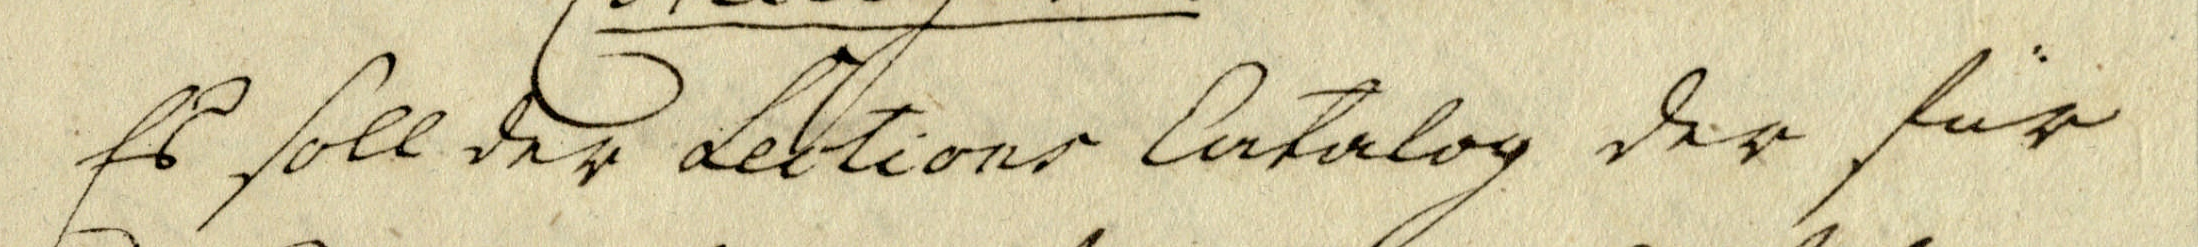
Es soll der Lections Catalog der für
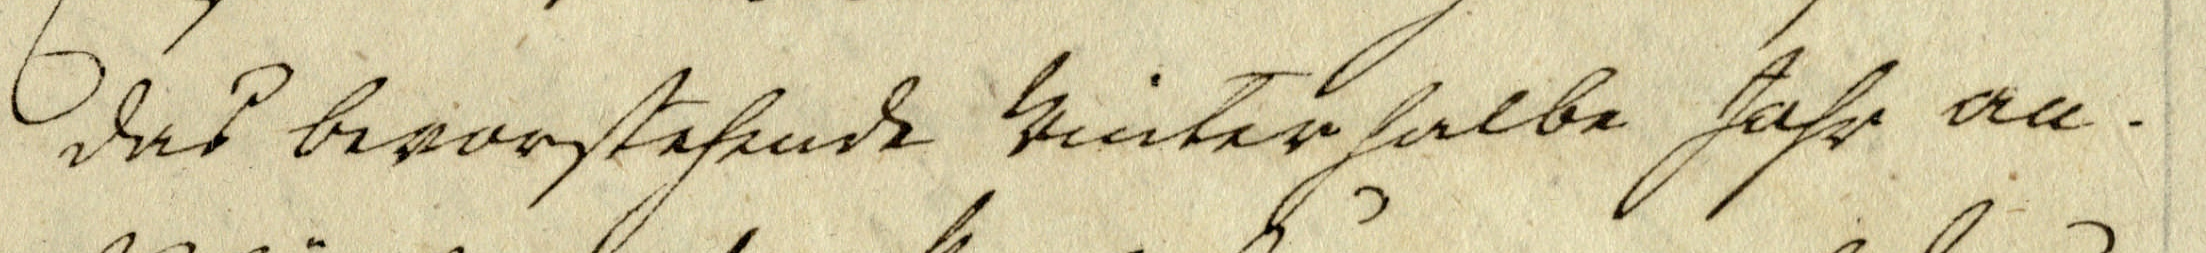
das bevorstehende Winterhalbe Jahr an¬
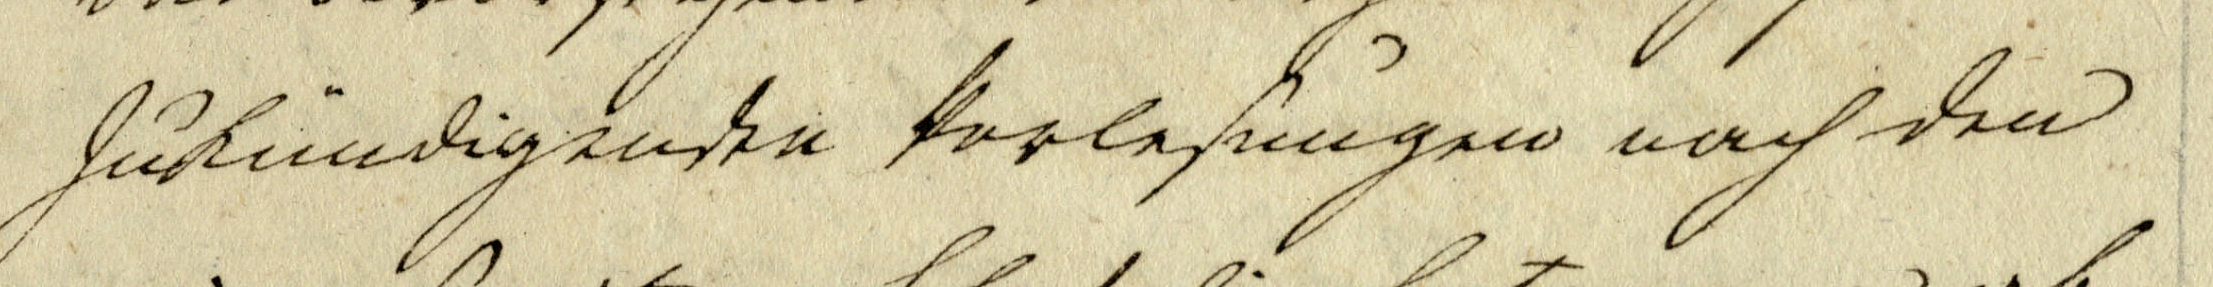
zukündigenden Vorlesungen nach den
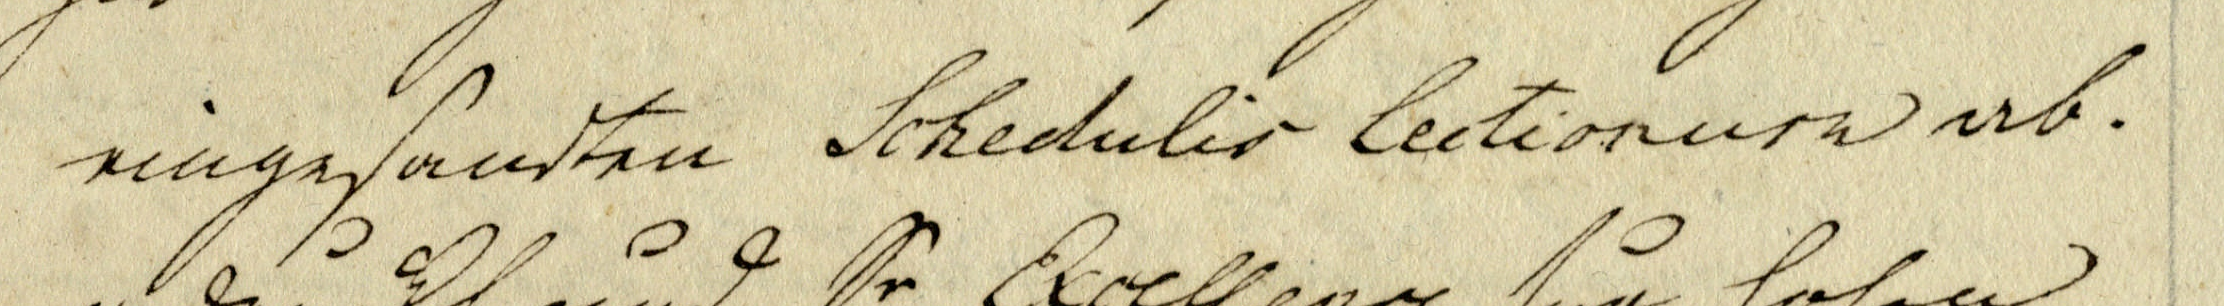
eingesandten Schedulis lectionum ab¬
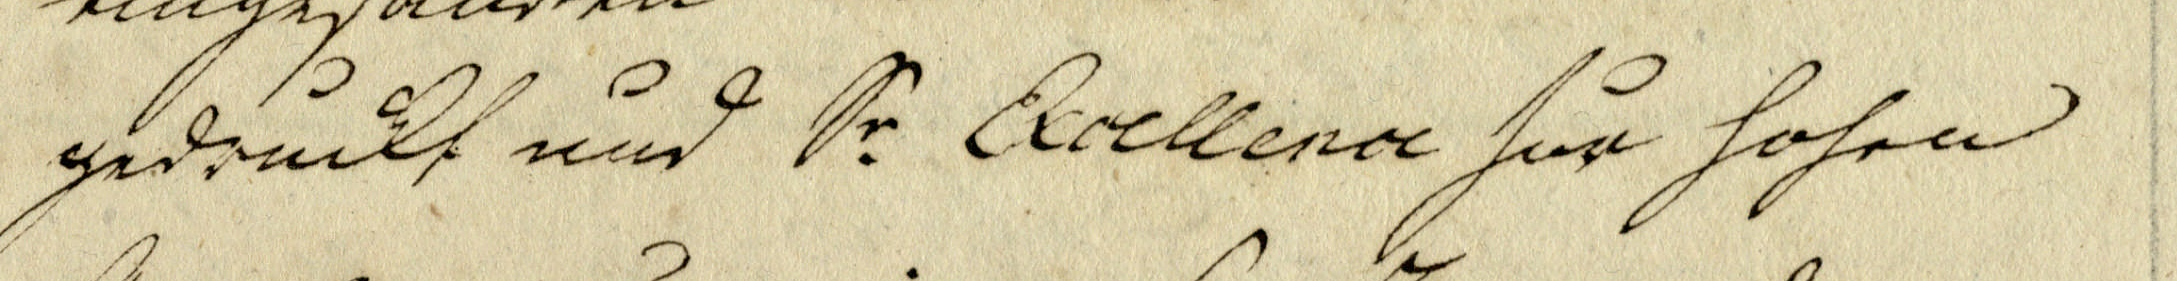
gedruckt und Sr Excellence zur hohen
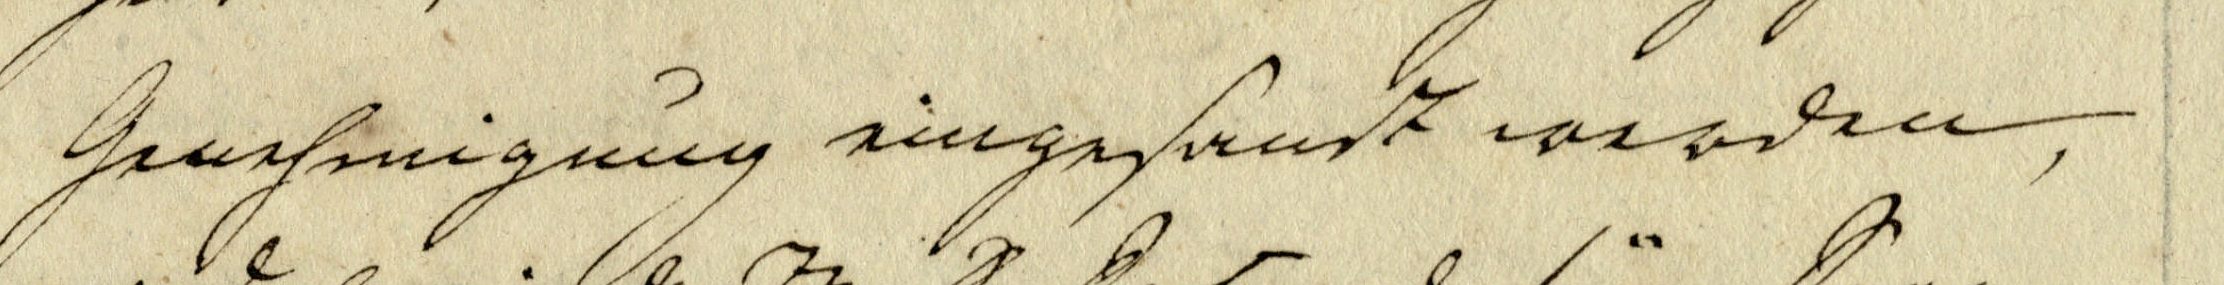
Genehmigung eingesandt werden,
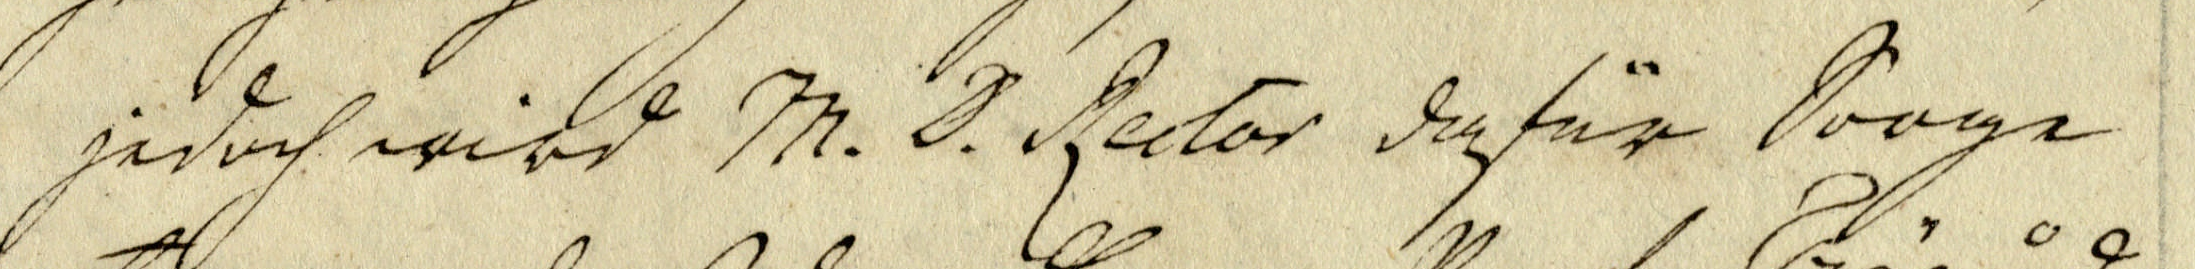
jedoch wird M. D. Rector dafür Sorge
